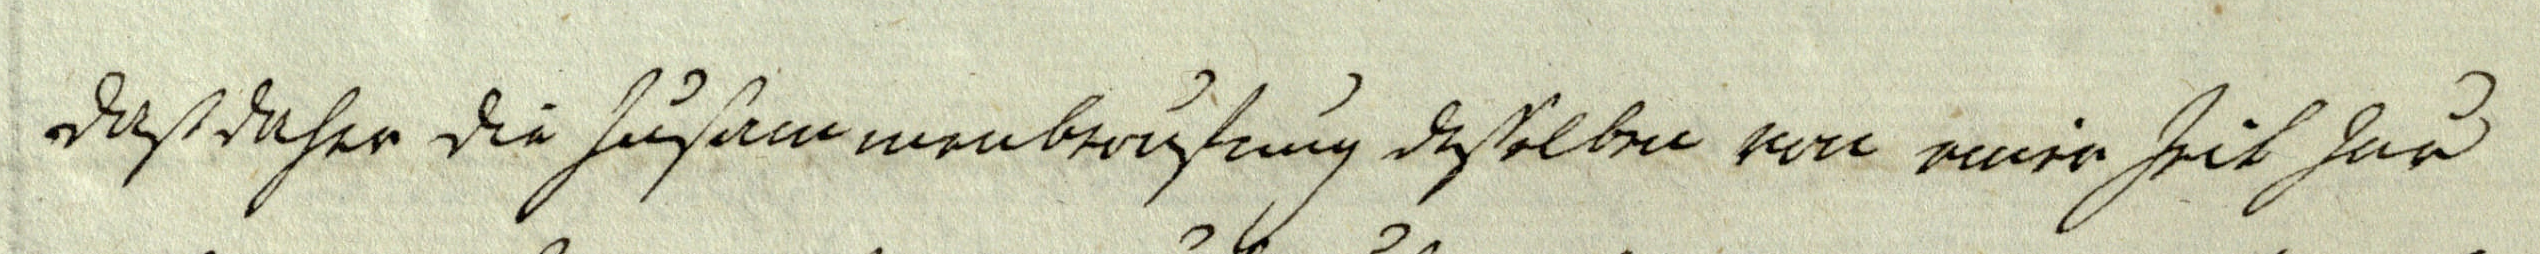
daß daher die Zusammenberufung desselben von einer Zeit zur
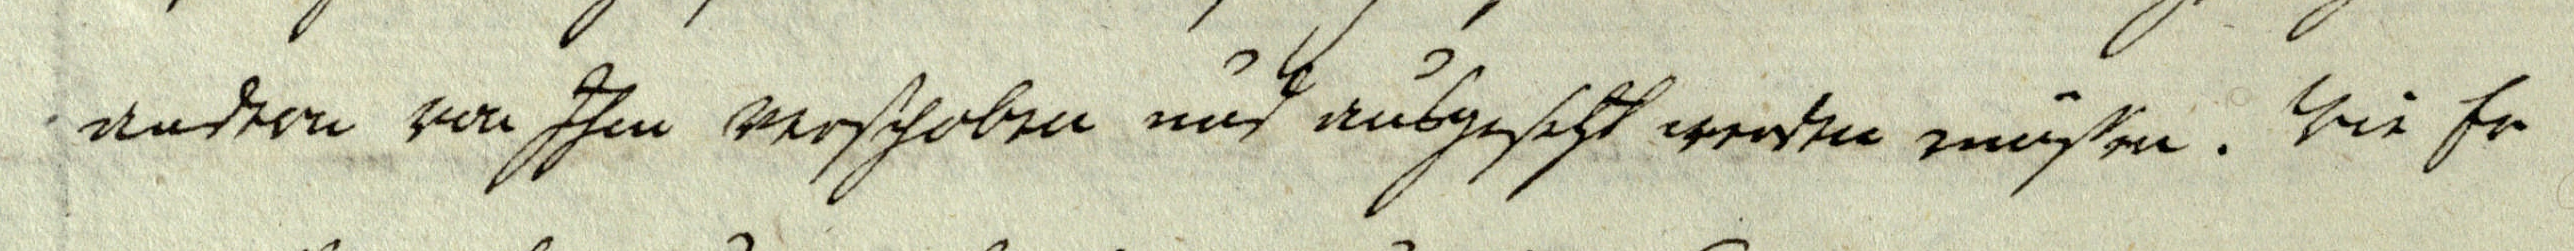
andern von Ihm verschoben und ausgesetzt werden müssen. Wie Er
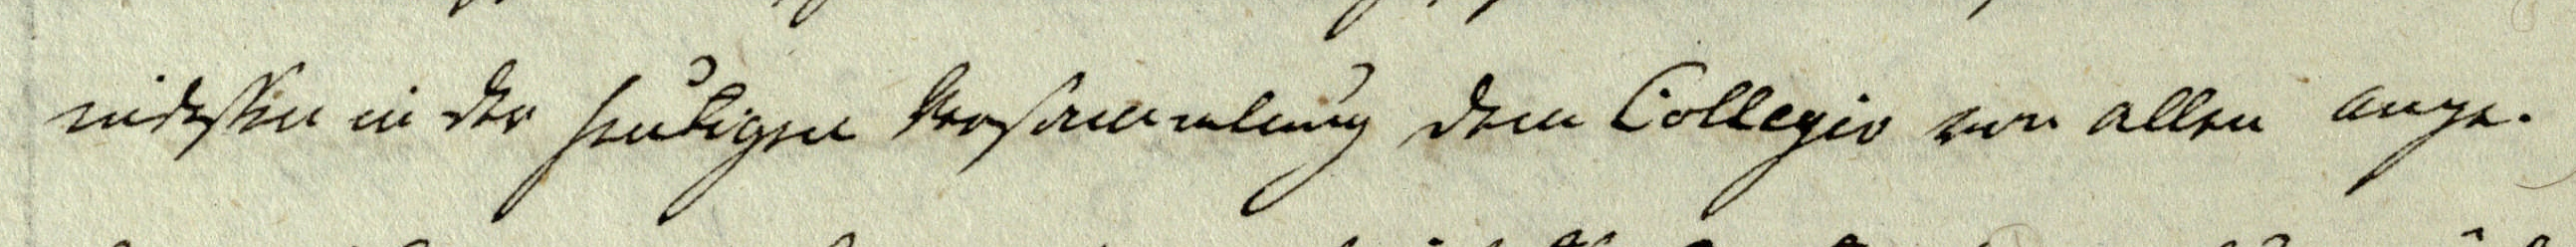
indessen in der heutigen Versammlung dem Collegio von allen Ange¬
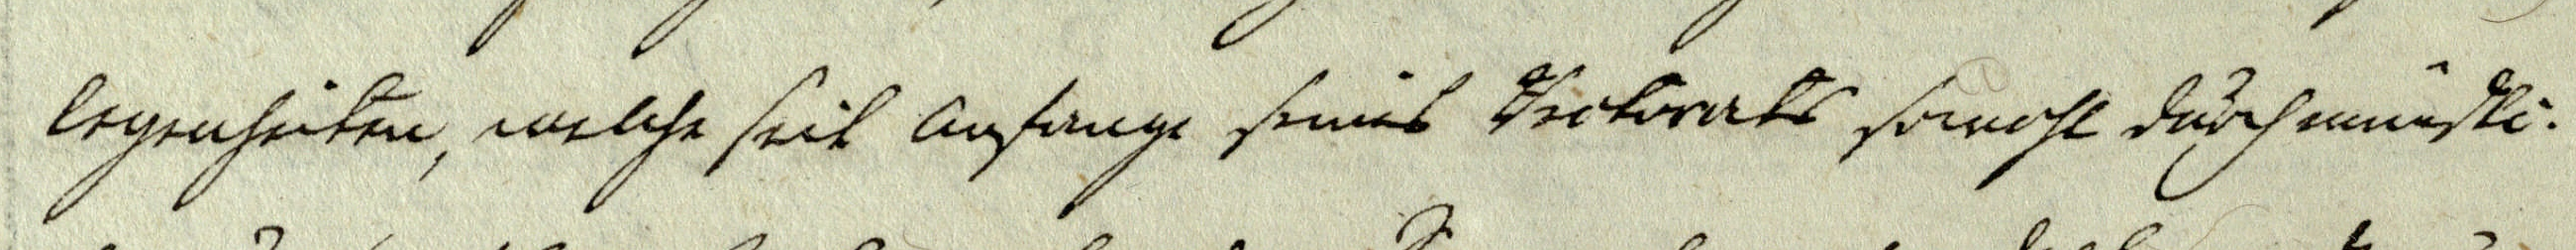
legenheiten, welche seit Anfange seines Rectorats sowohl durch mündli¬
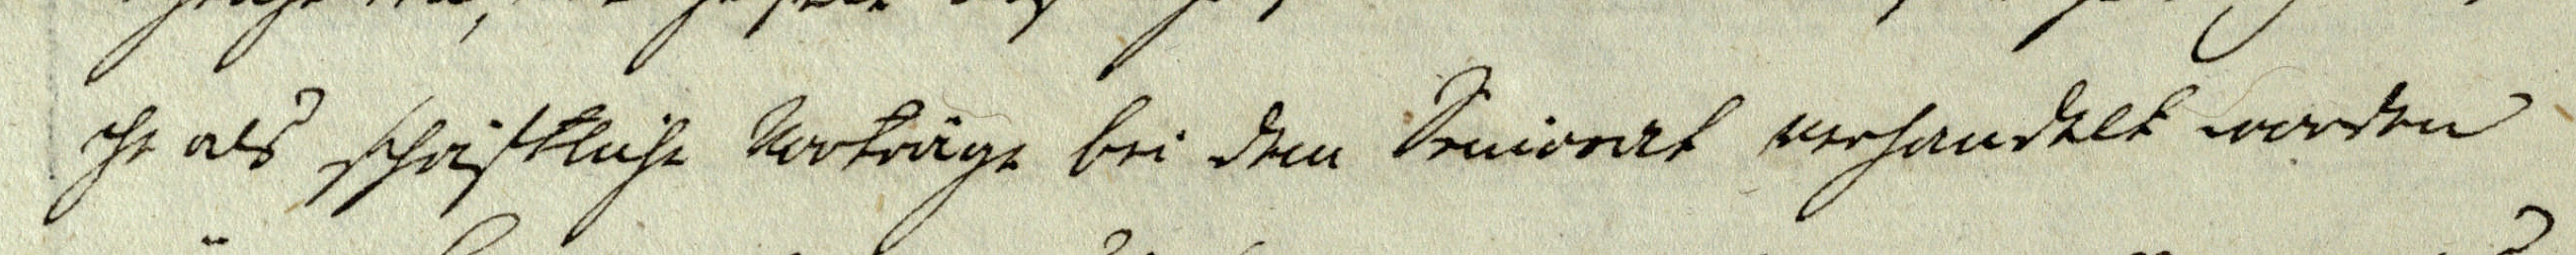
che als schriftliche Vorträge bei dem Seniorat verhandelt worden
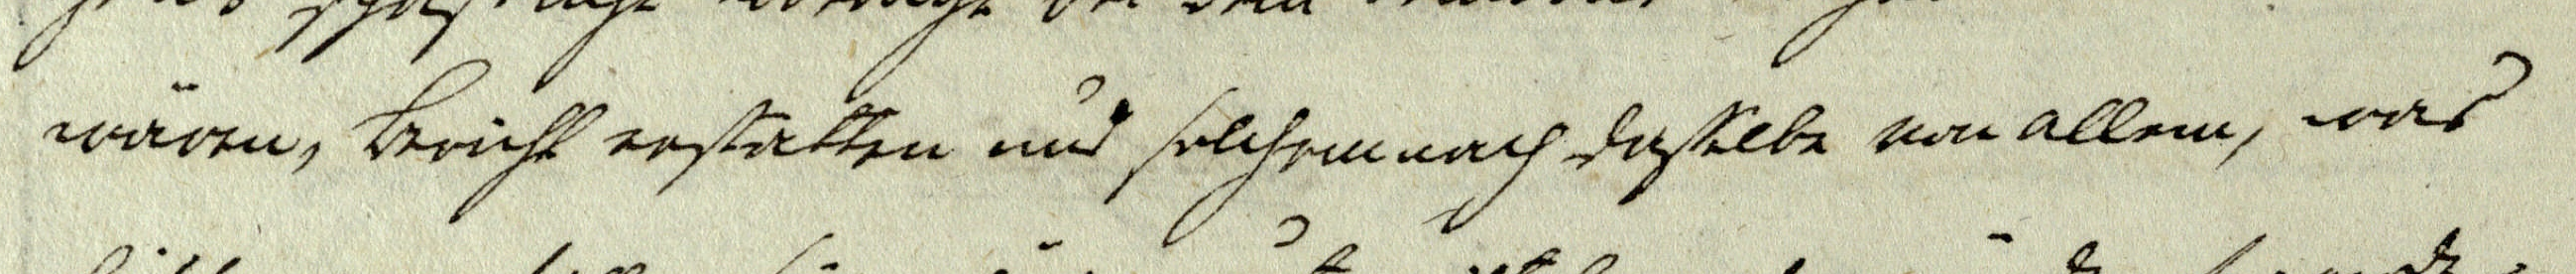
wären, Bericht erstatten und solchemnach dasselbe von allem, was
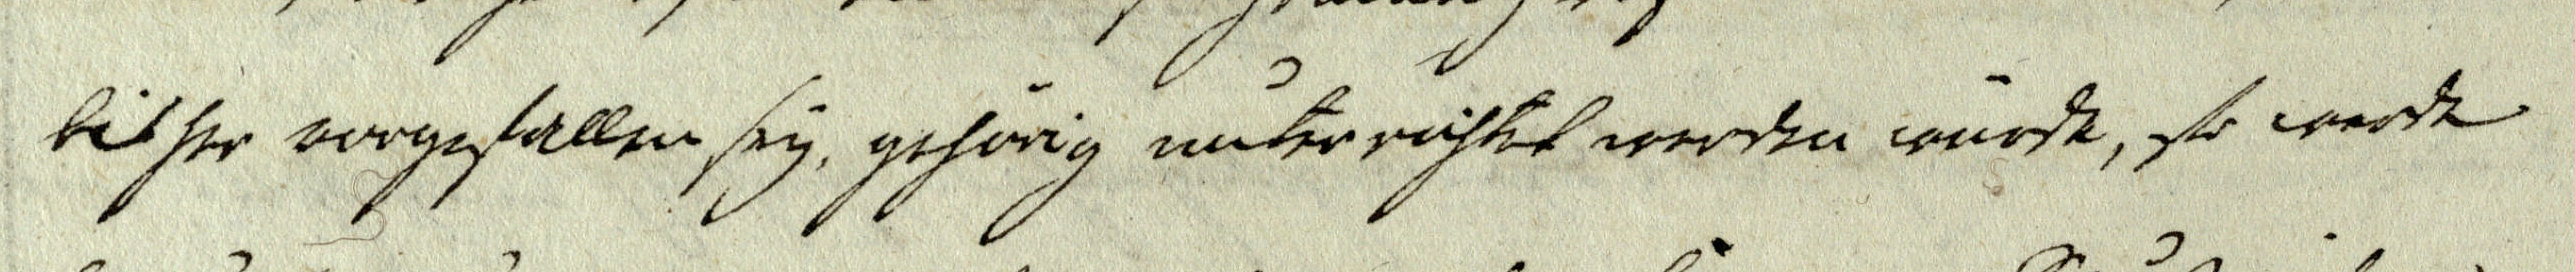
bisher vorgefallen seÿ, gehörig unterrichtet werden würde, so werde
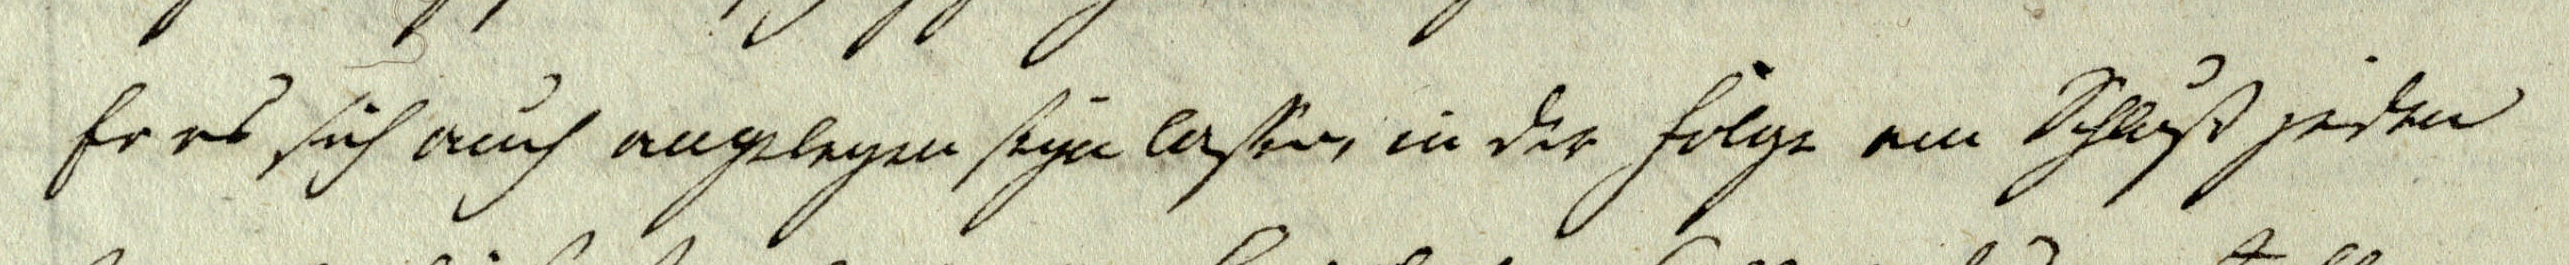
Er es sich auch angelegen seÿn lassen, in der Folge am Schluß jeden
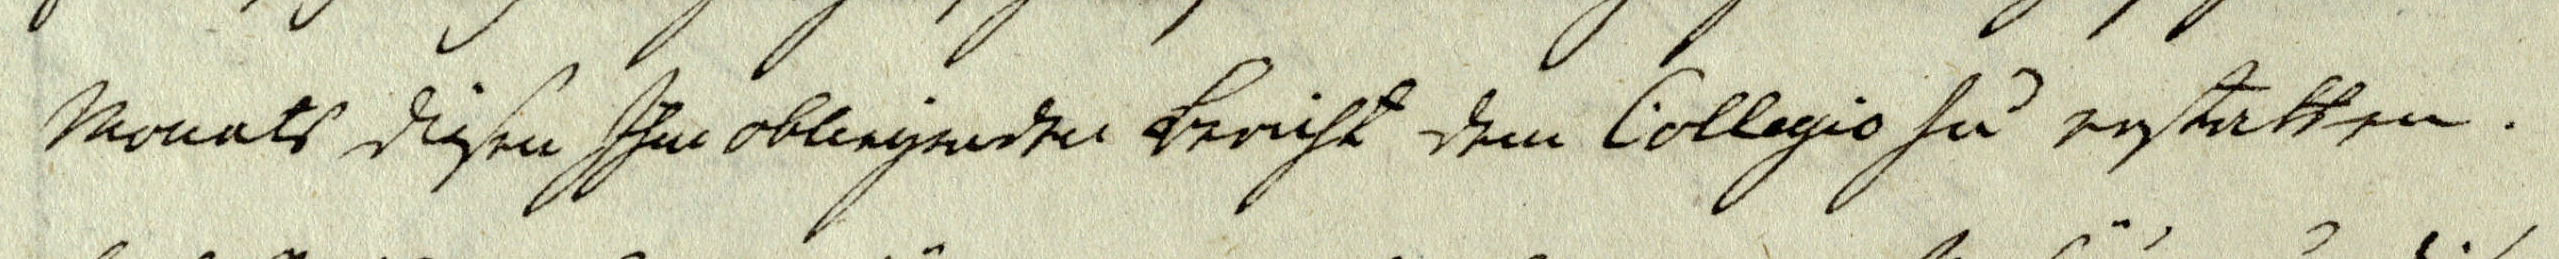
Monats diesen Ihm obliegenden Bericht dem Collegio zu erstatten.
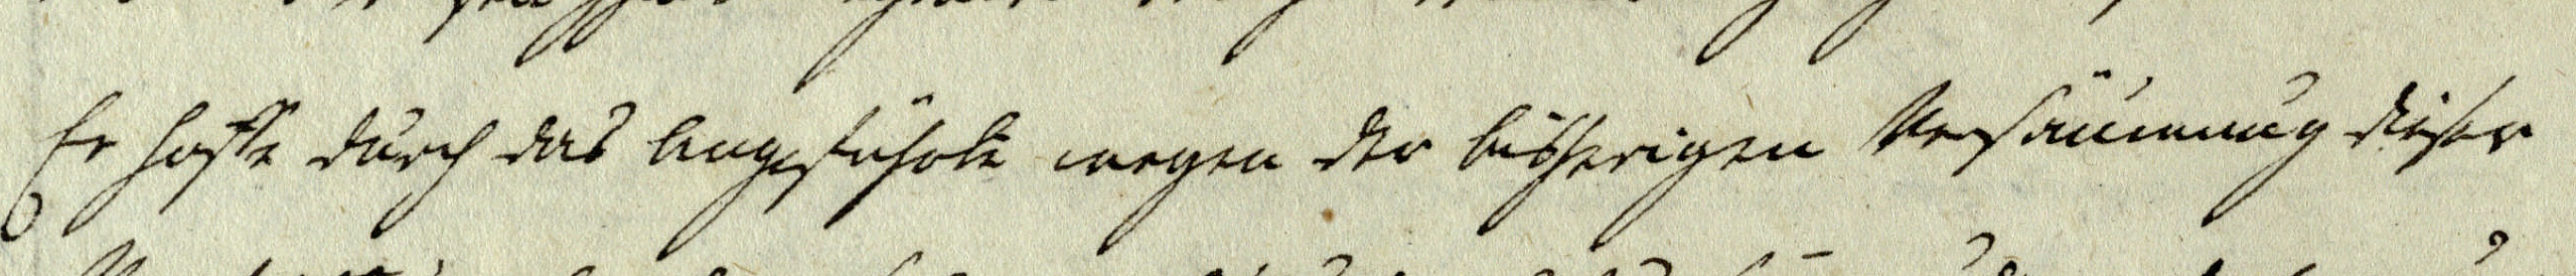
Er hoffe durch das Angeführte wegen der bisherigen Versäumung dieser
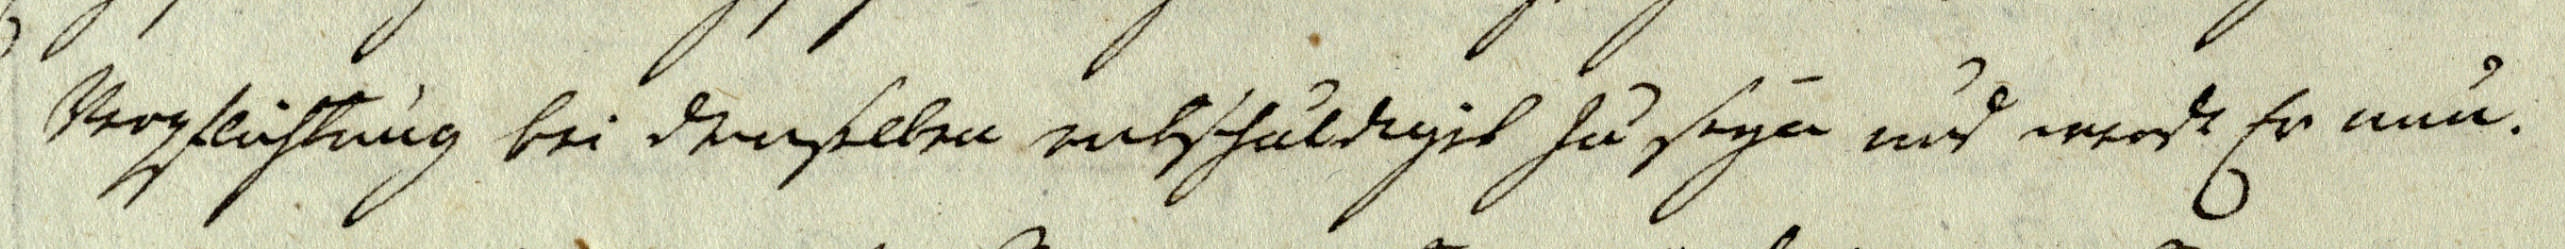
Verpflichtung bei demselben entschuldiget zu seÿn und werde Er nun¬
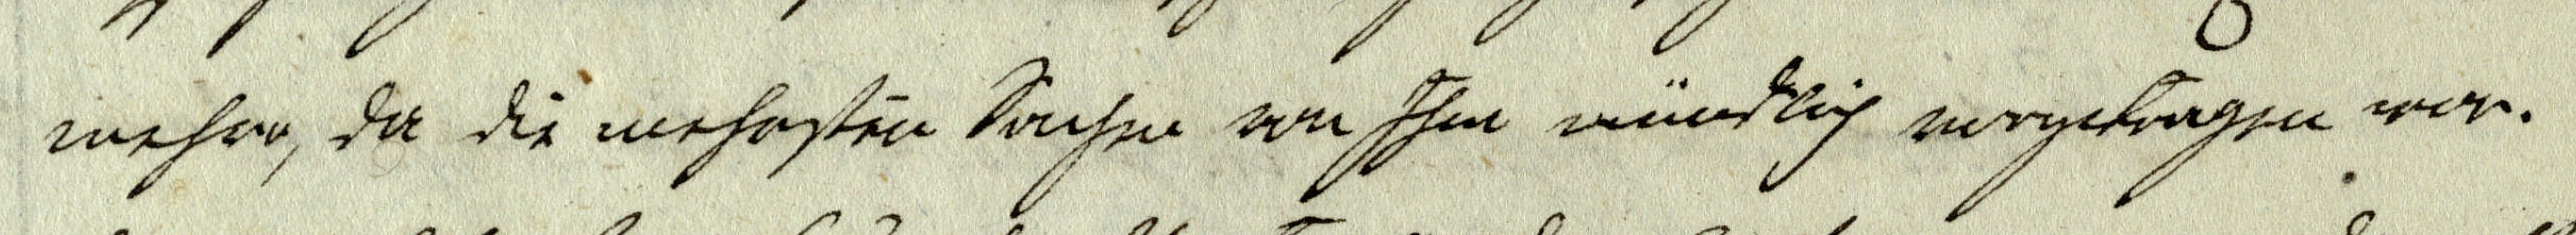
mehro, da die mehrsten Sachen von Ihm mündlich vorgetragen wor¬
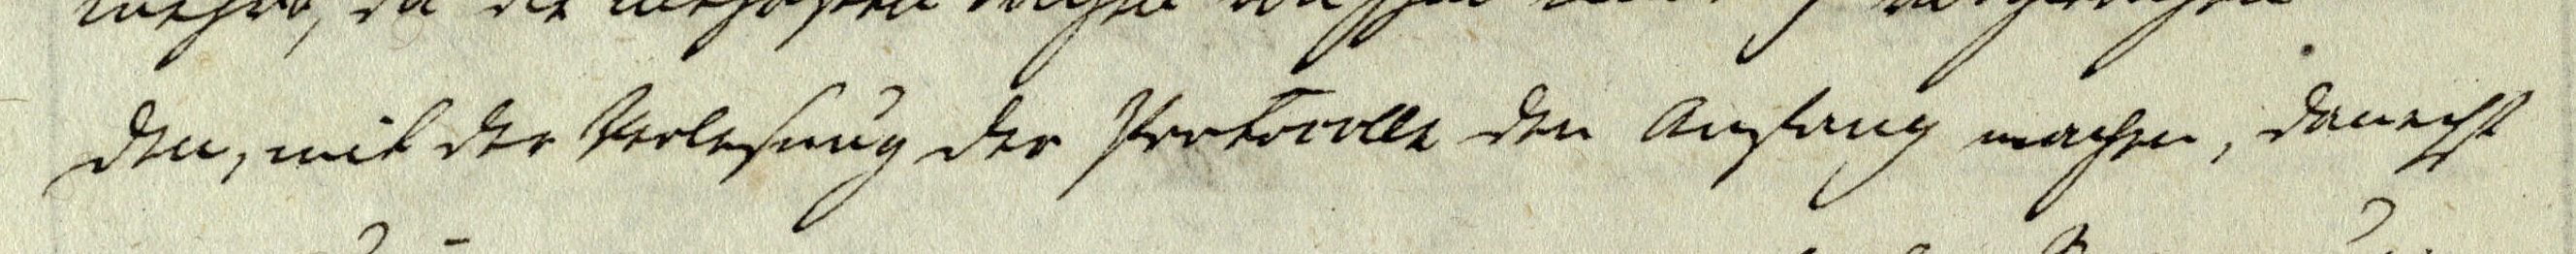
den mit der Verlesung der Protocolle den Anfang machen, danechst
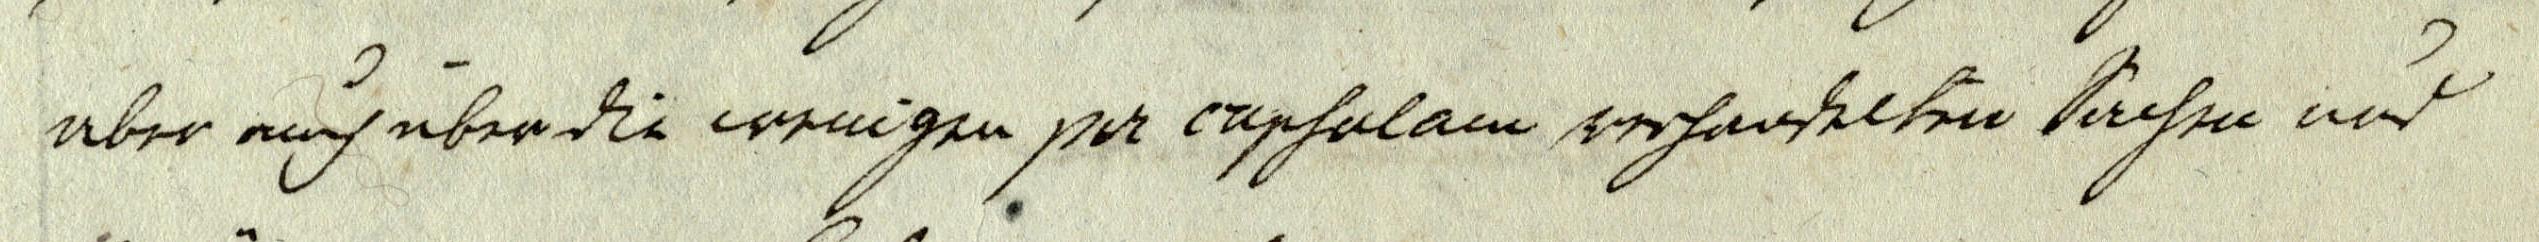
aber auch über die wenigen per capsulam verhandelten Sachen und
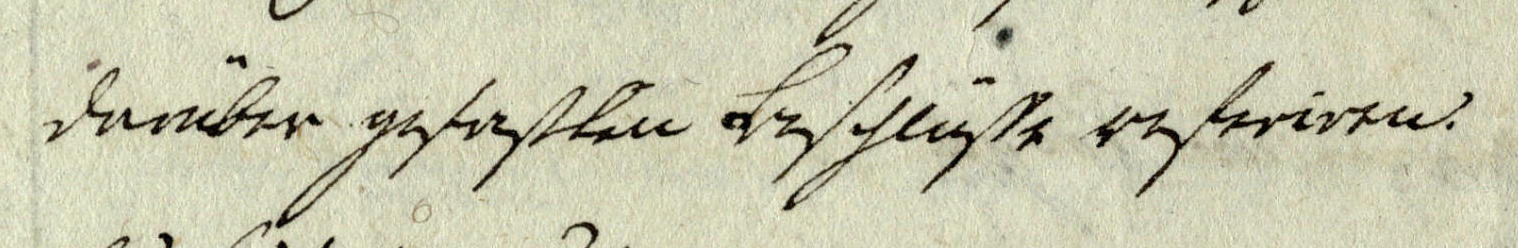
darüber gefaßten Beschlüsse referiren.
